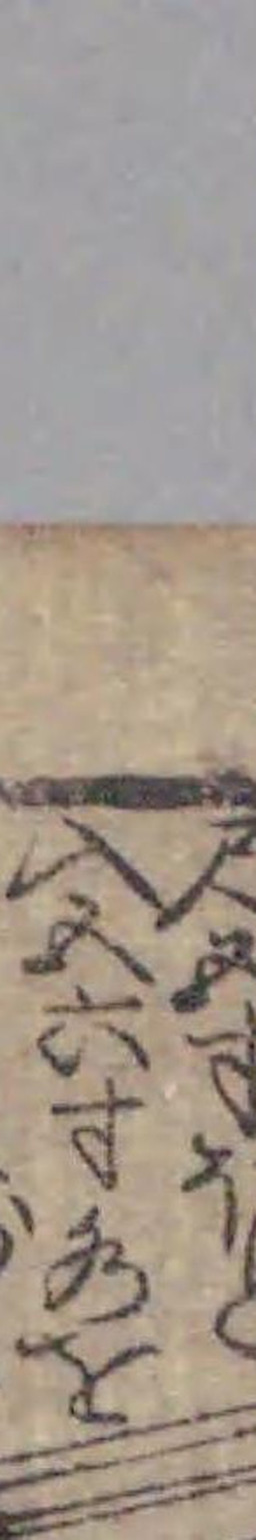入五六寸水を
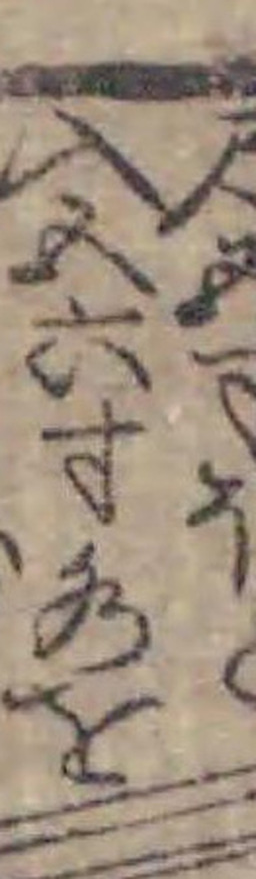入五六寸水を
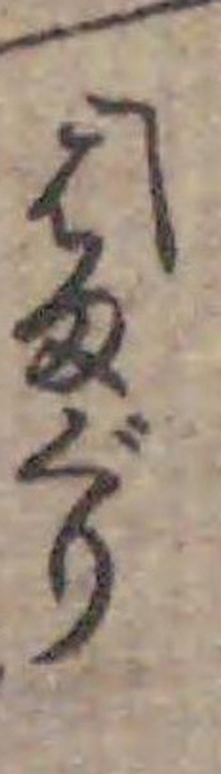〽はまぐり
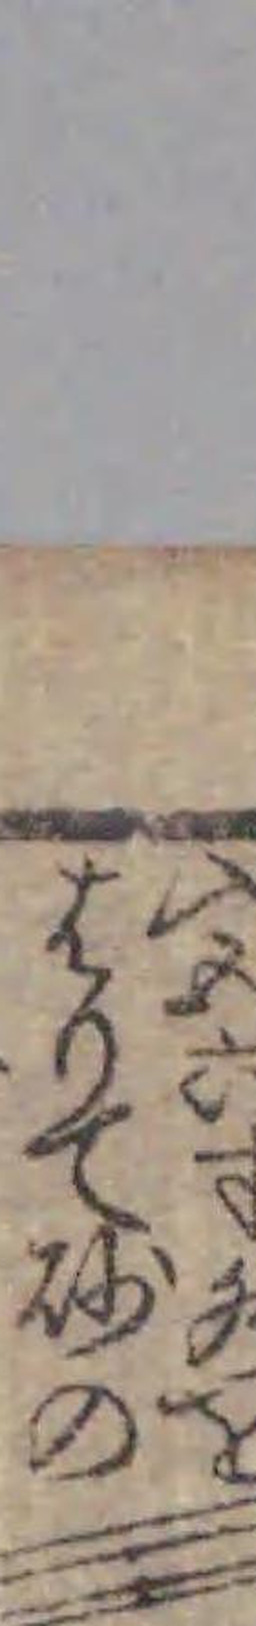はりて砂の
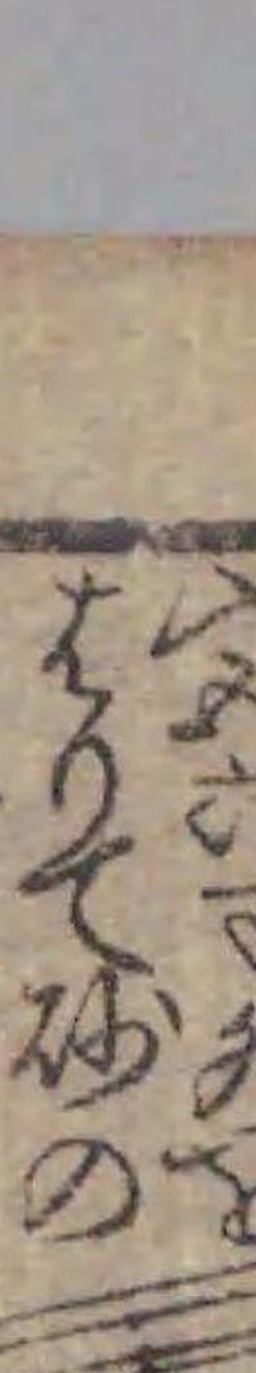はりて砂の
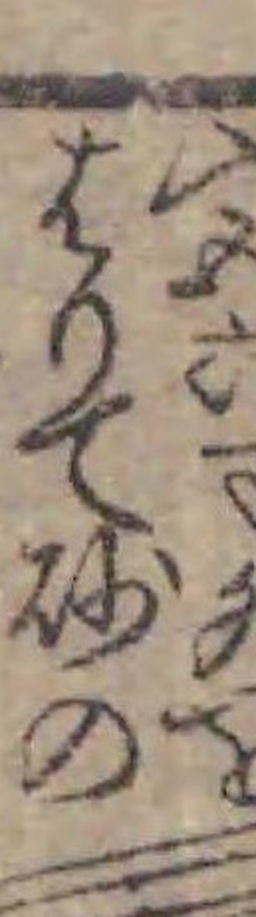はりて砂の
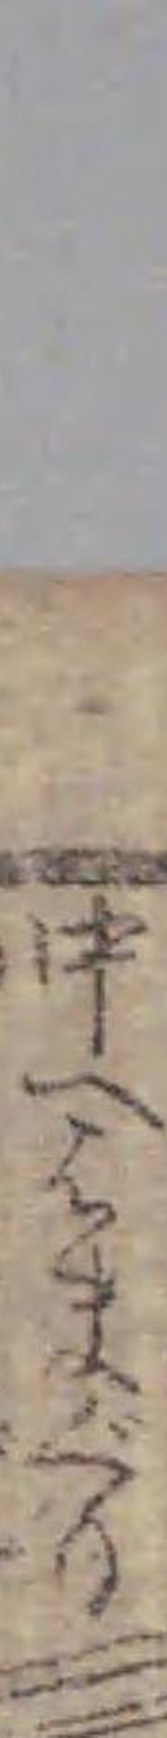中へはまぐり
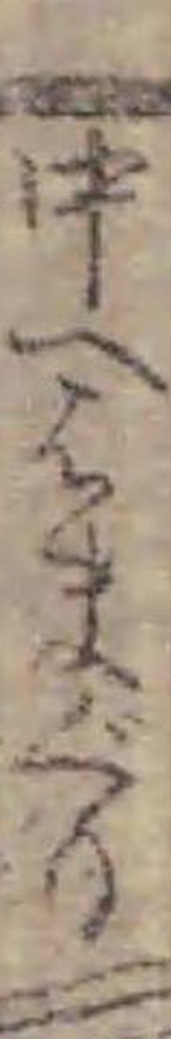中へはまぐり
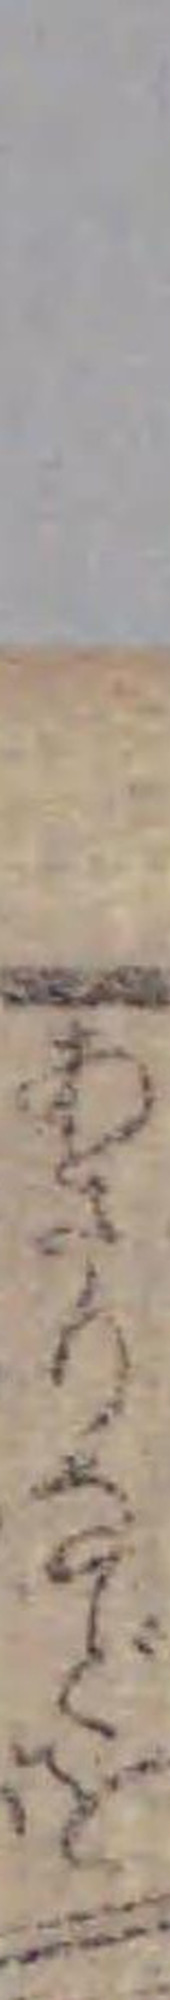あさりなどを
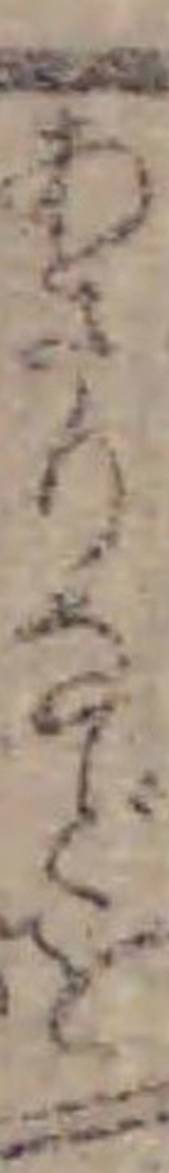あさりなどを
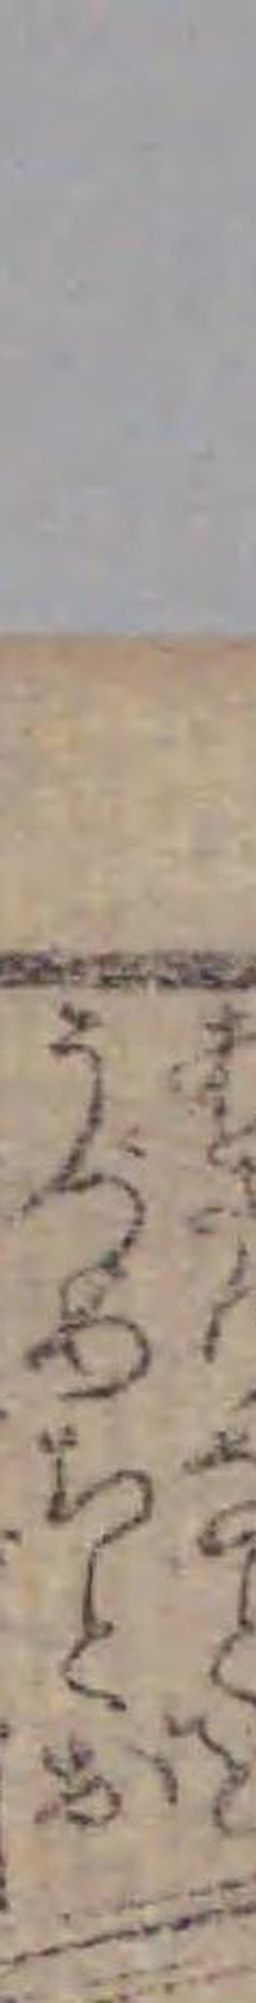うづめちとお
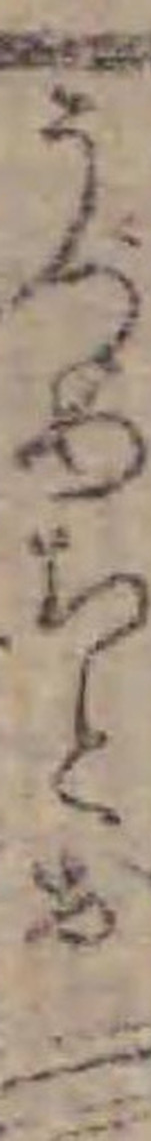うづめちとお
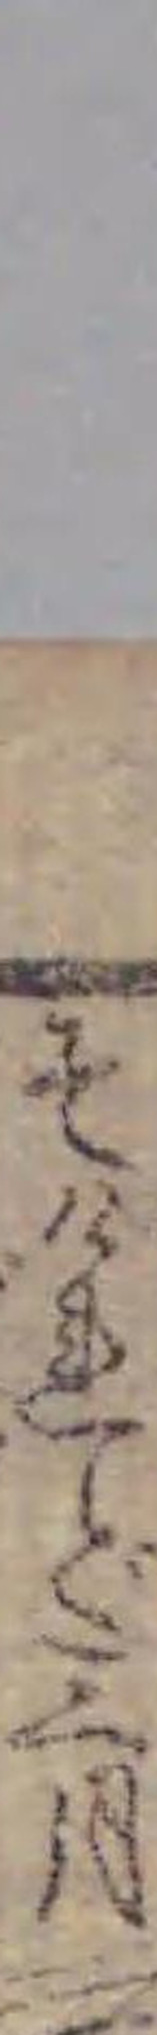そけれど三月
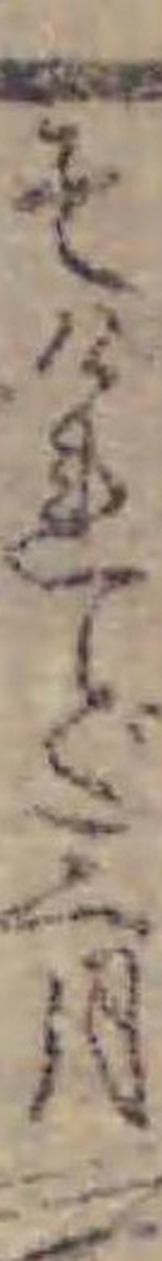そけれど三月
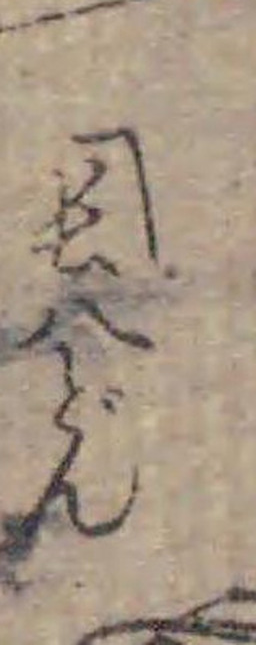〽長八どん
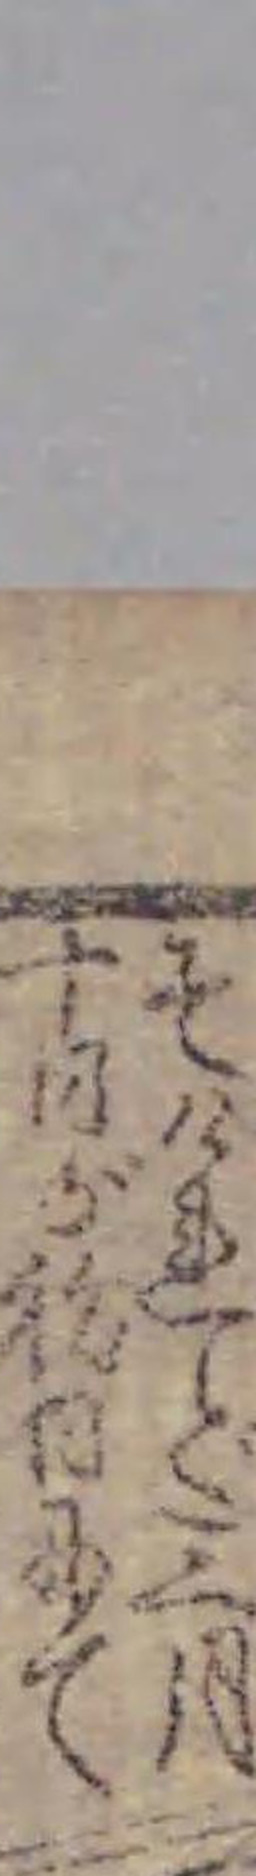十日が日にて
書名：本樹真猿浮気噺 : 3巻
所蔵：国立国会図書館 National Diet Library, JAPAN
